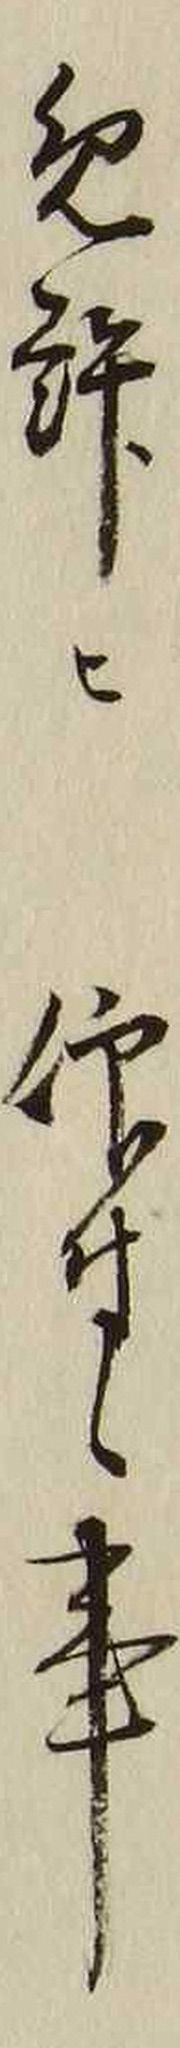免許被仰付候事
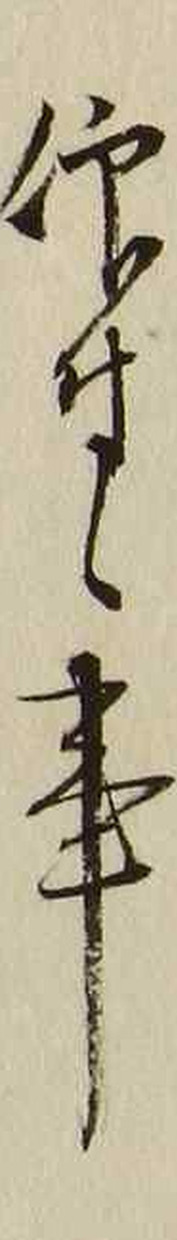仰付候事
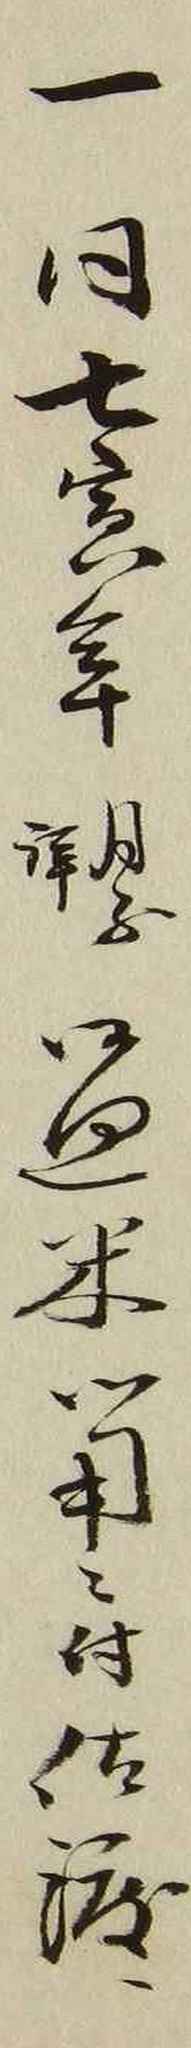一同七寅年月不詳御廻米御用ニ付佐渡へ
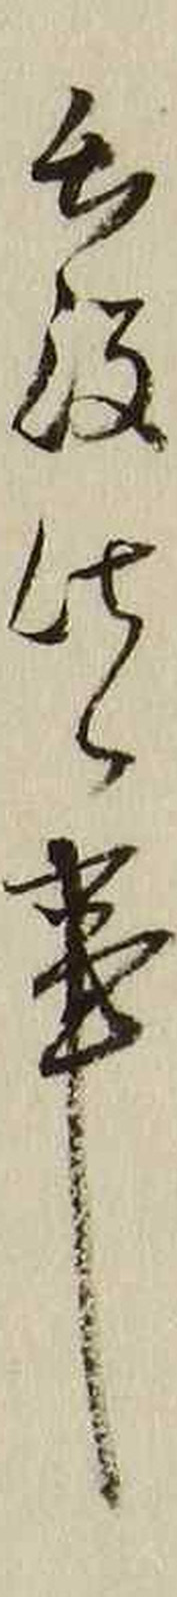出役仕候事
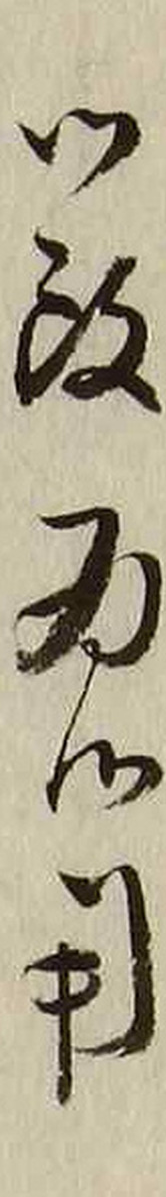御改為御用
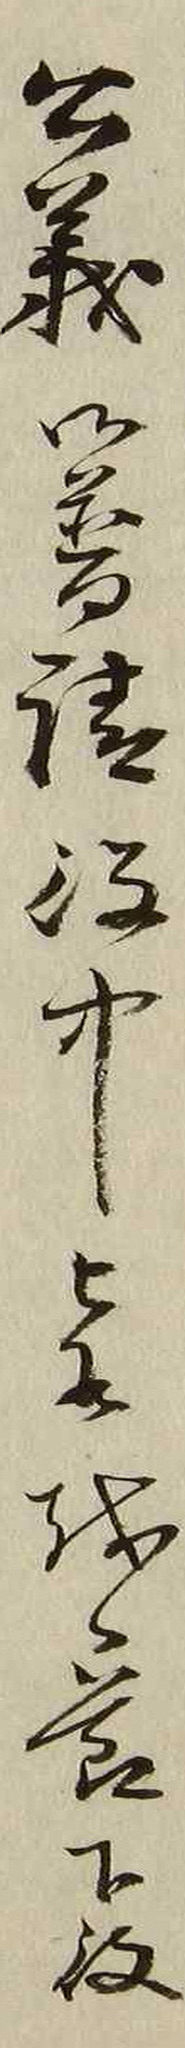公義御普請役中被相越候節下役
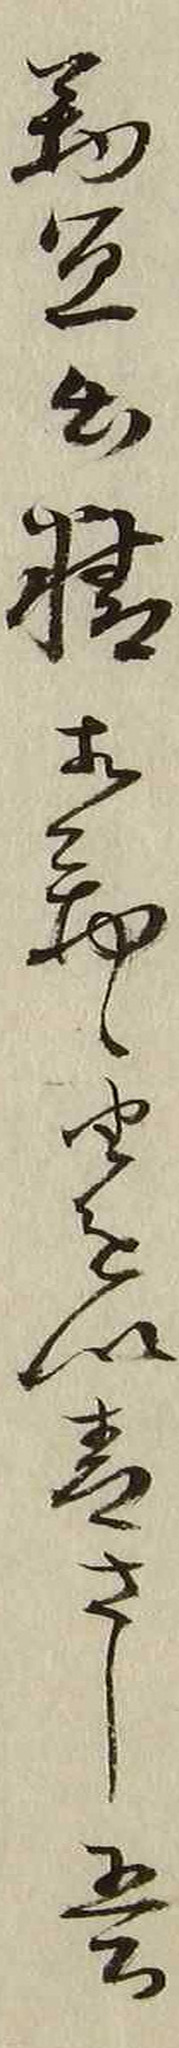勤宜出精相勤候由を以青さし五百
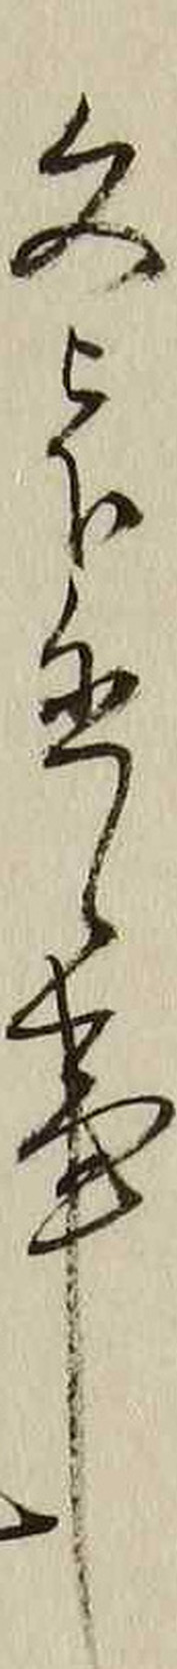文被下置候事
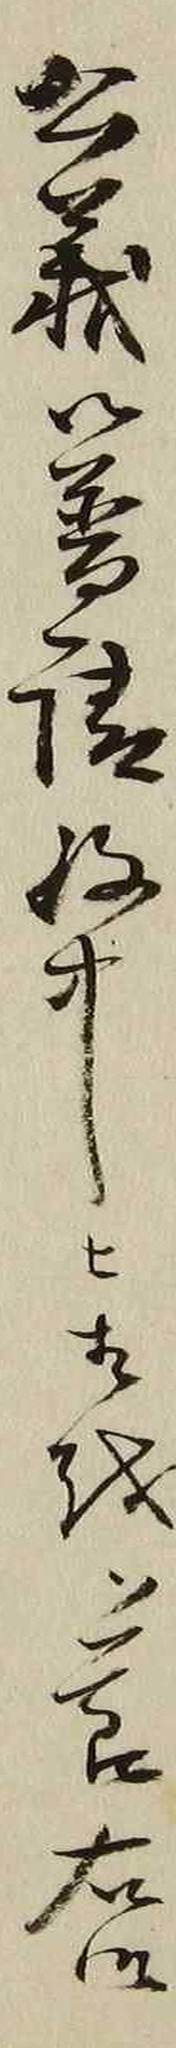公義御普請役中被相越候節右御
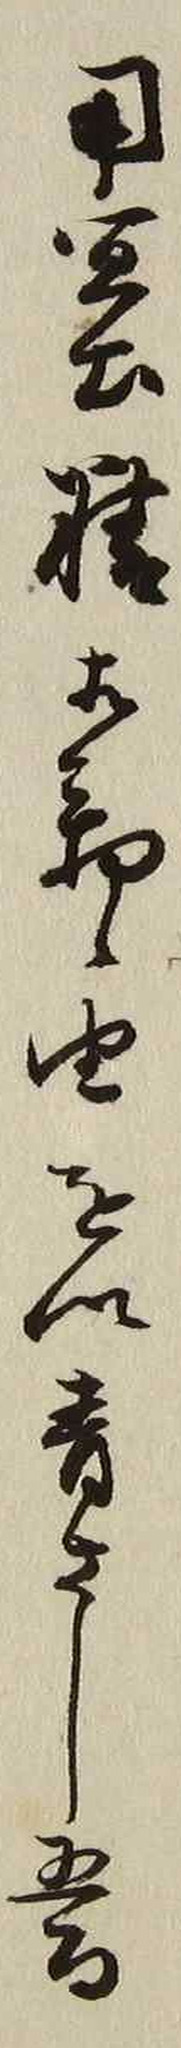用宜出精相勤候由を以青さし五百
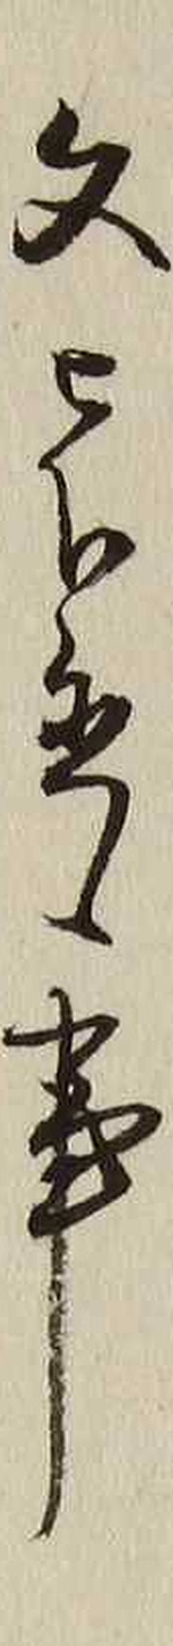文被下置候事
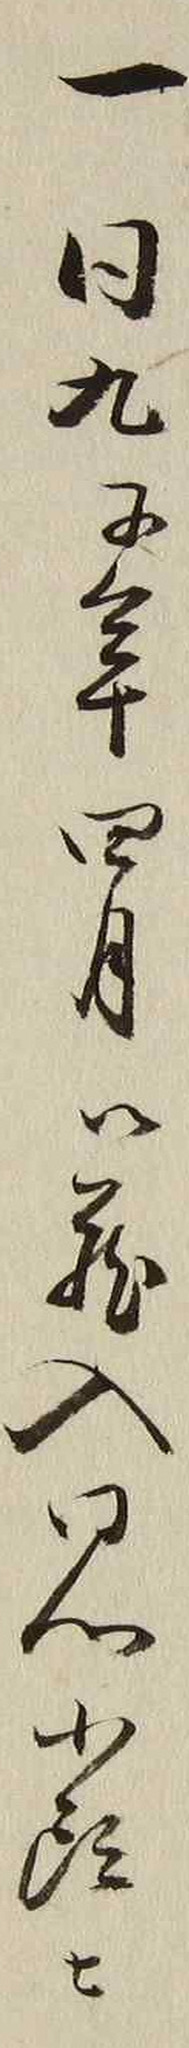一同九子年四月御蔵入同心小頭被
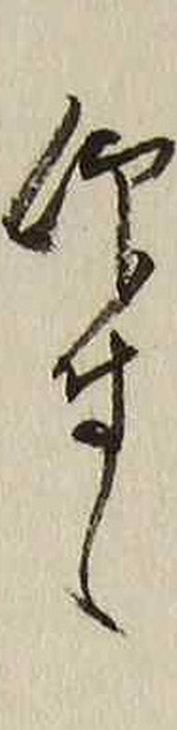仰付候
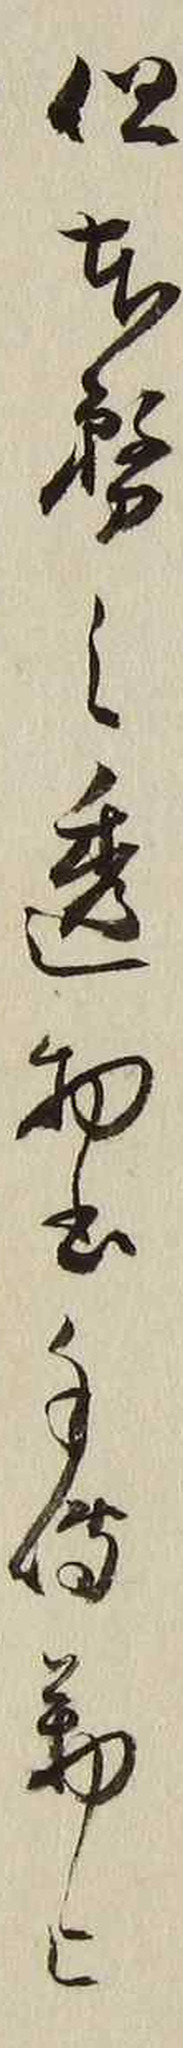但本務之透物書手伝勤被
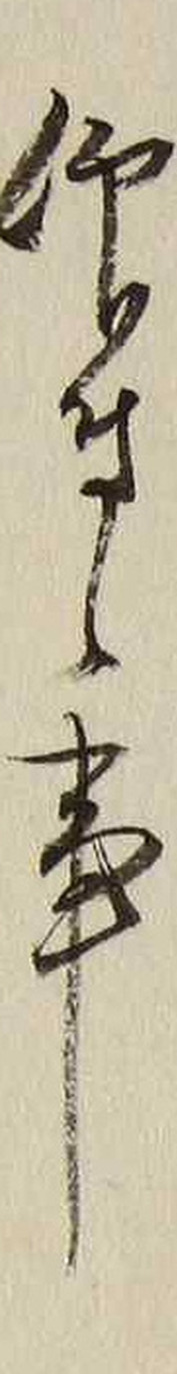仰付候事
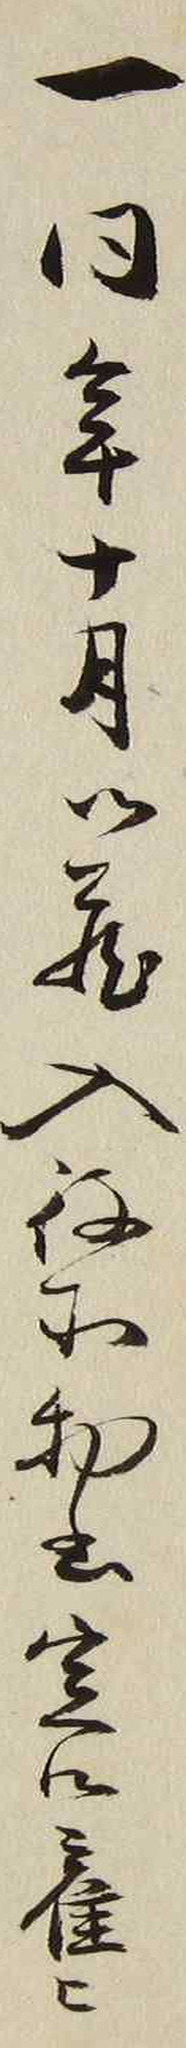一同年十月御蔵入役所物書定御雇被
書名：諸士系譜　巻之291　さ之部23
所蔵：会津若松市立会津図書館
